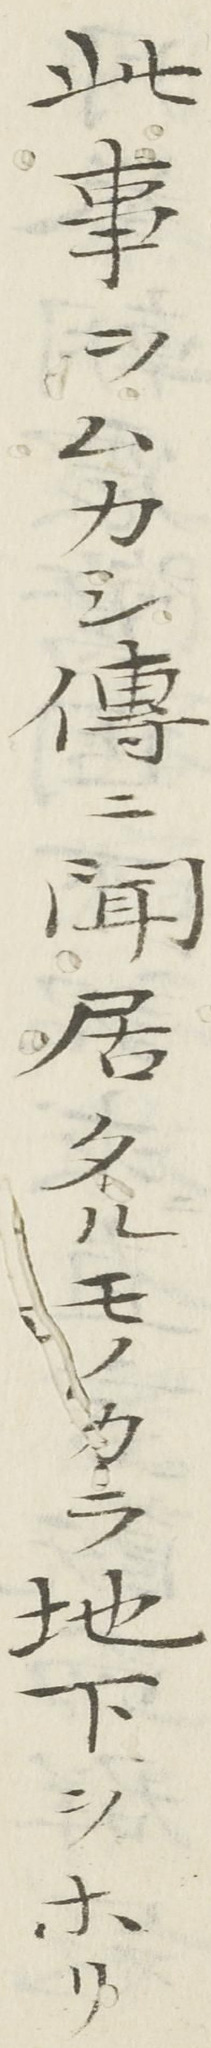此事ヲムカシ伝ニ聞居タルモノカラ地下ヲホリ
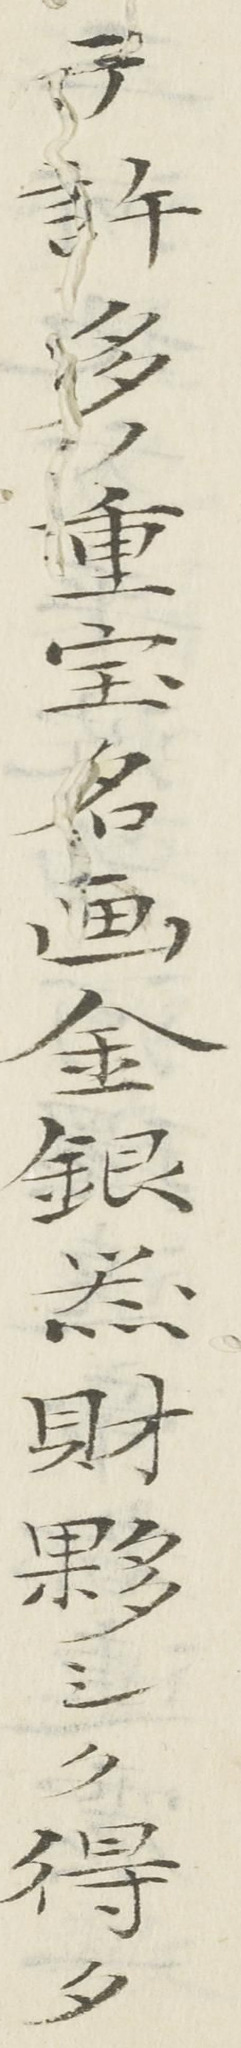テ許多ノ重宝名画金銀器財夥シク得タ
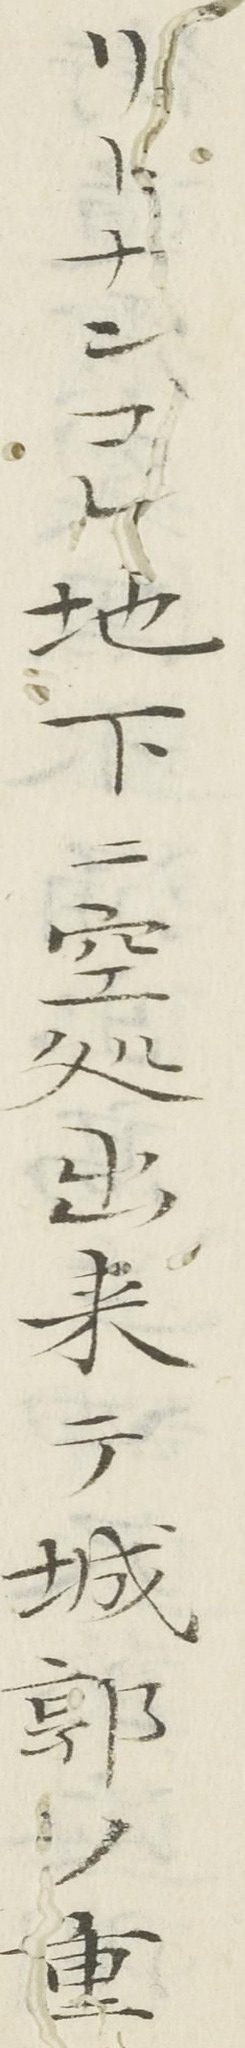リトナンコレ地下ニ空処出来テ城郭ノ重
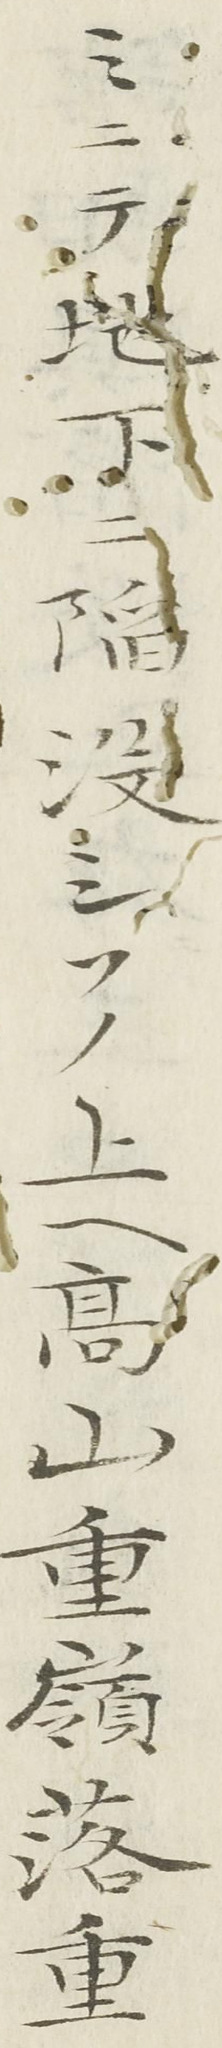ミニテ地下ニ陥没シフノ上ヘ高山重嶺落重
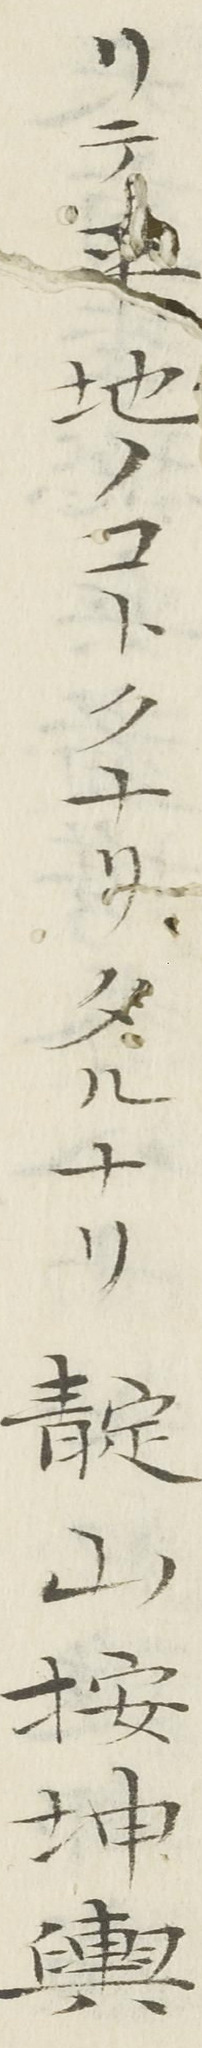リテ平地ノコトクナリタルナリ靛山按坤輿
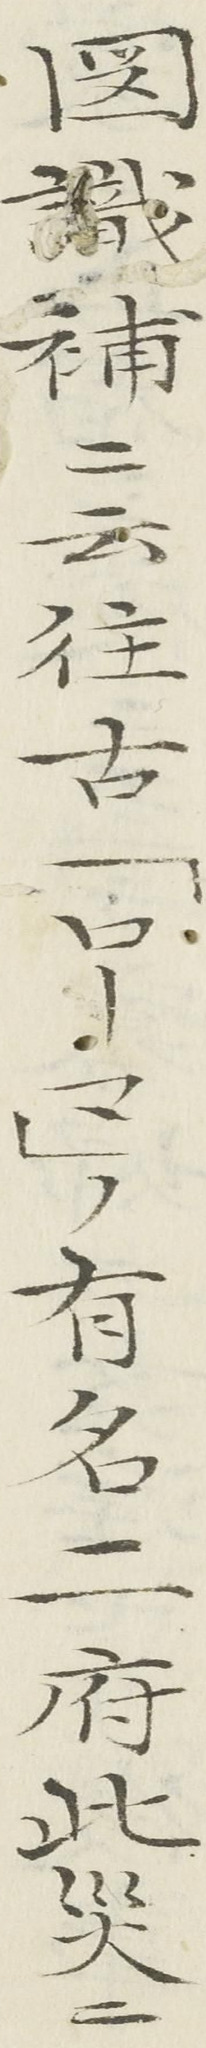図識補ニ云往古「ローマ」ノ有名ニ府此災ニ
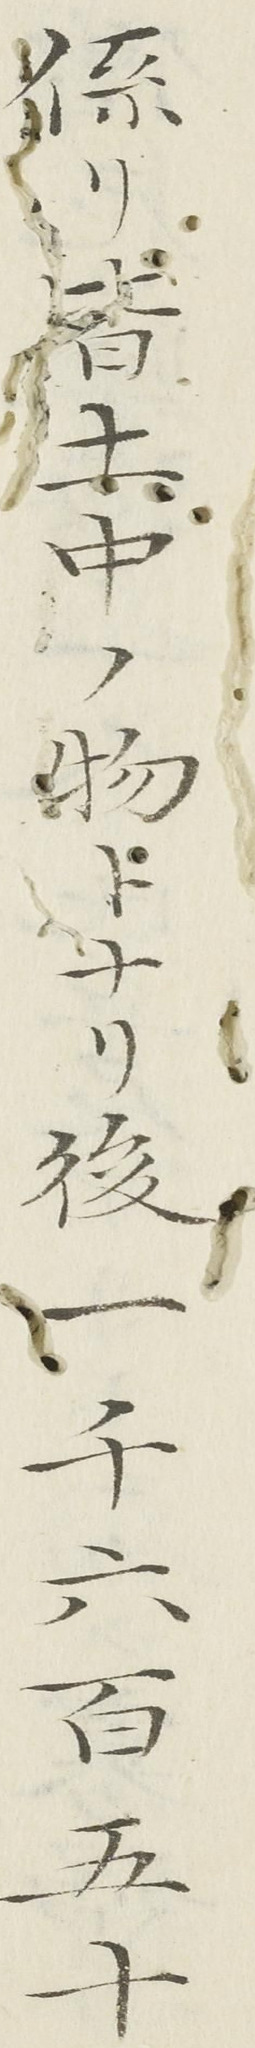係リ皆土中ノ物トナリ後千六百五十
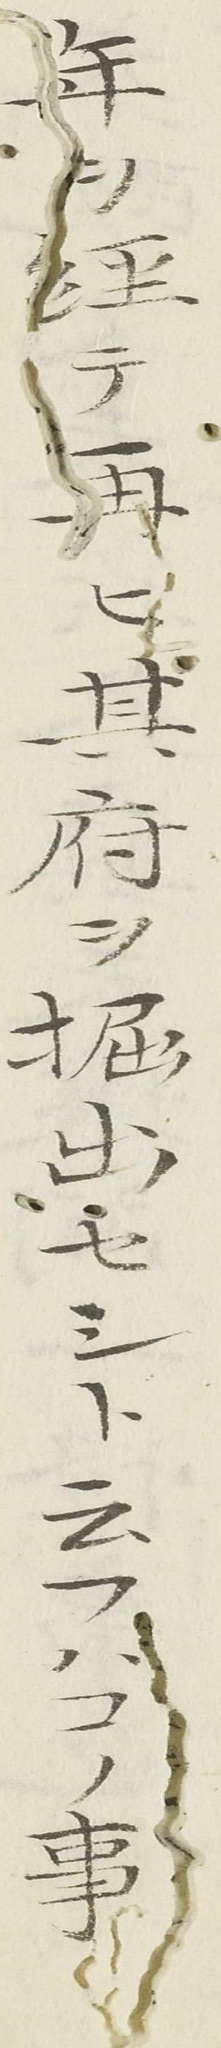年ヲ経テ再ヒ其府ヲ掘出セシト云フハコノ事
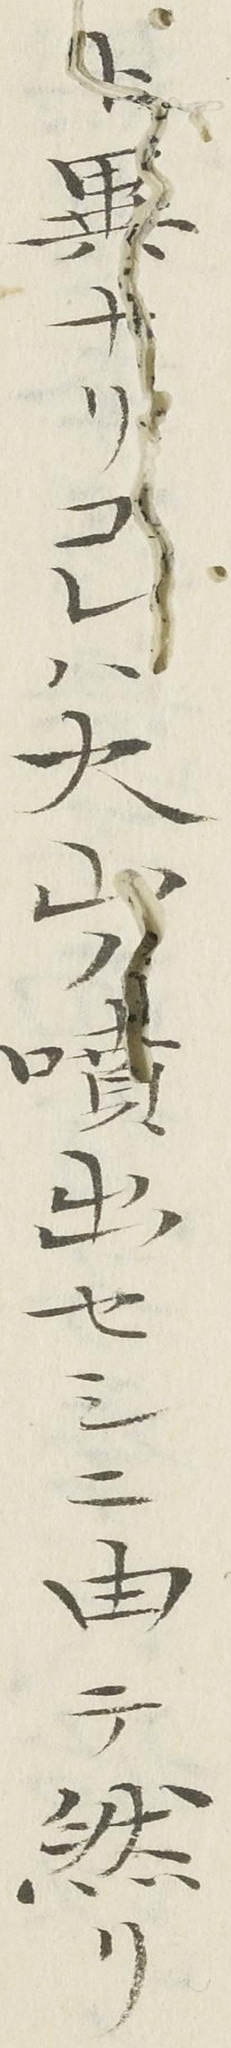ト異ナリコレハ火山ノ噴出セシニ由テ叱リ
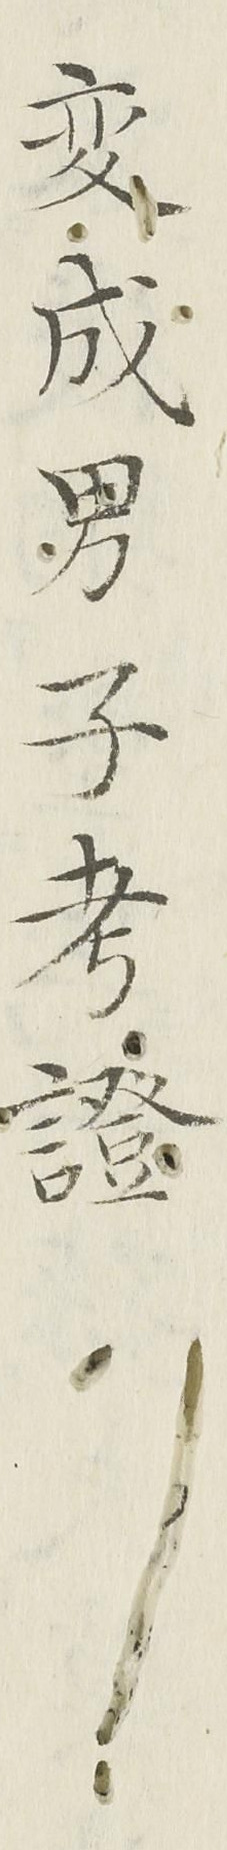変成男子考証
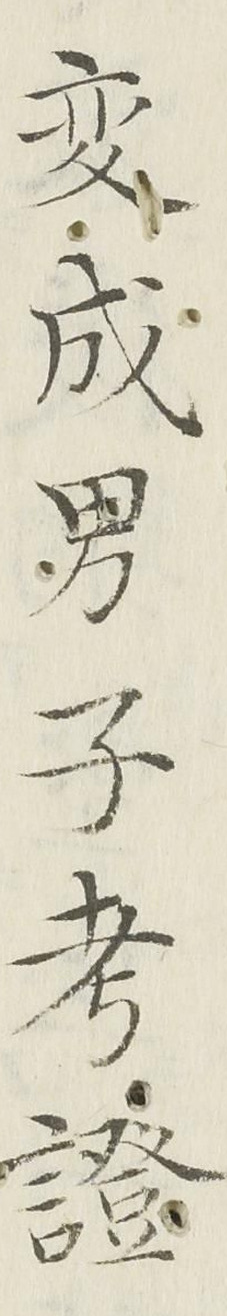変成男子考証
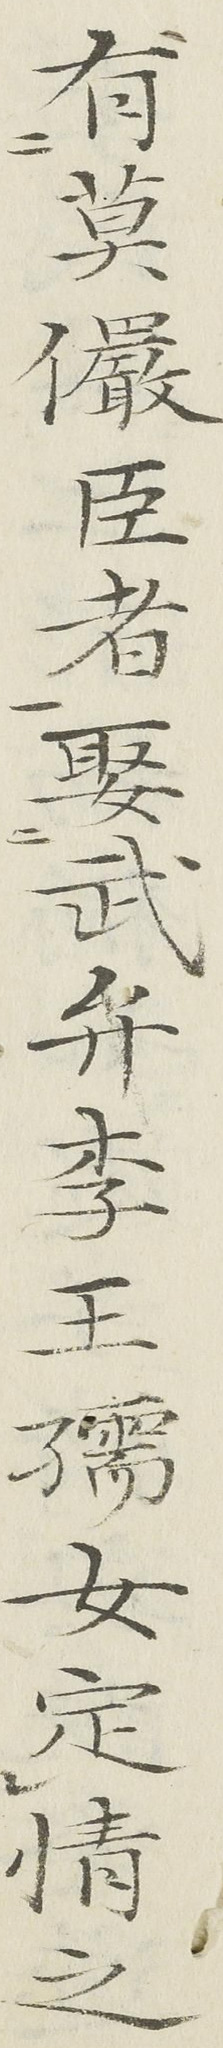有莫儼臣者娶武弁李王孺女定情之
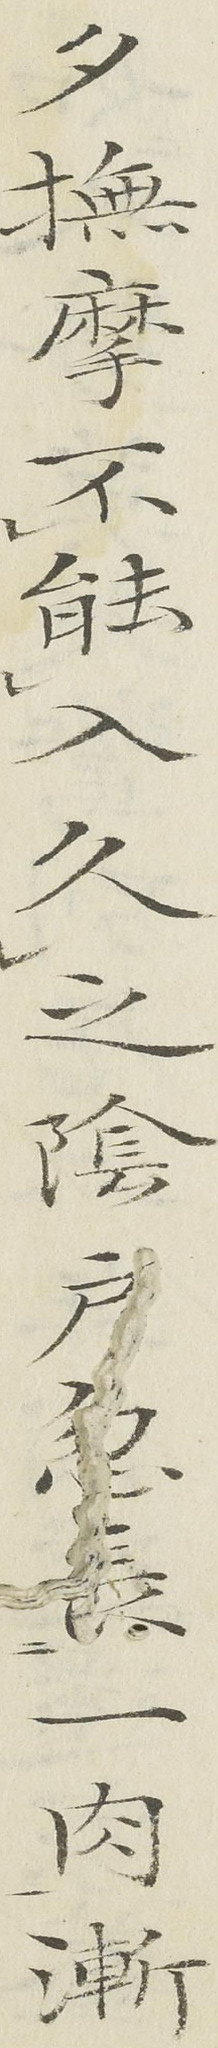夕撫摩不能入久之陰戸忽長一肉漸

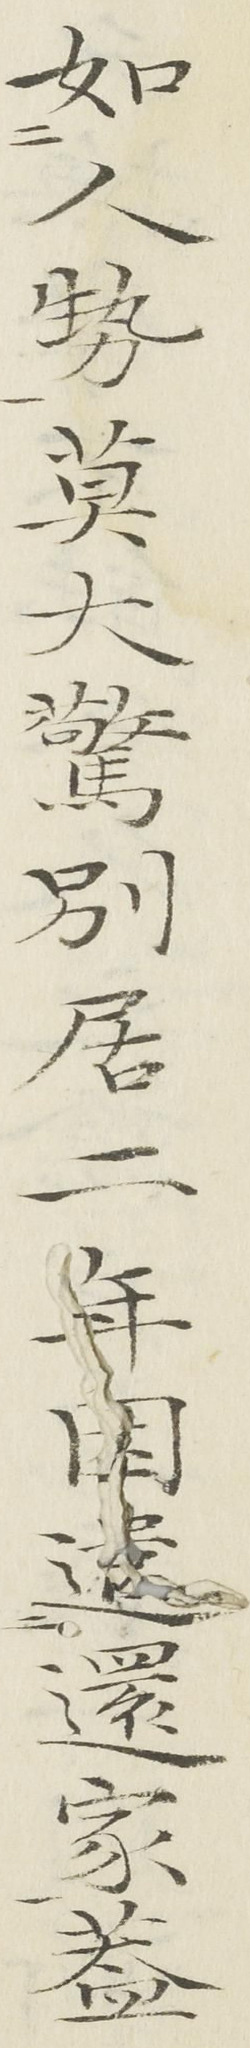如人勢莫大驚別居弐年因往還家益
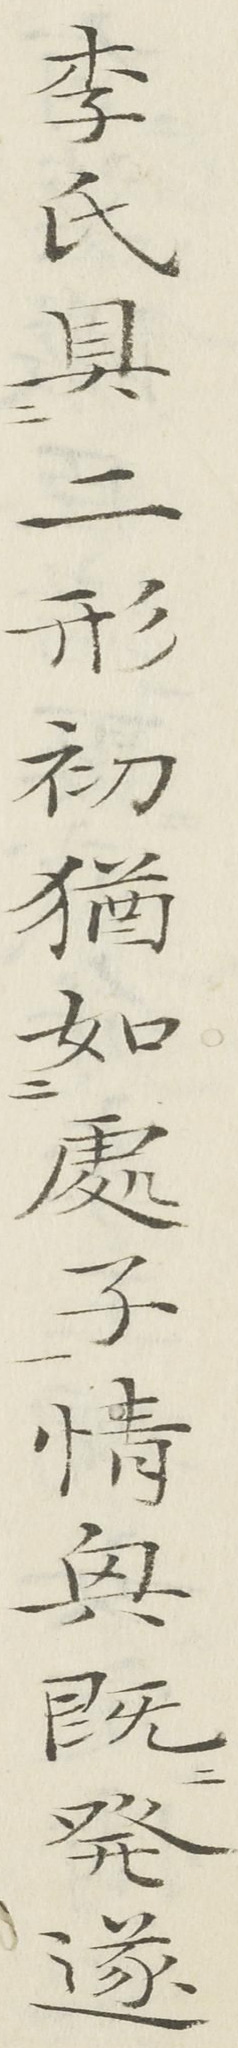李氏具二形初猶如処子情奥既ニ発遂
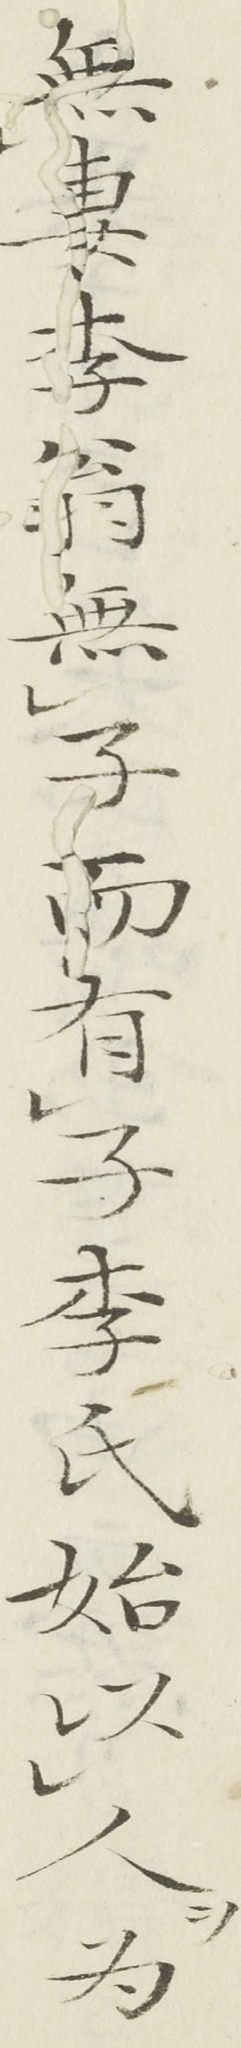無妻李翁無子而有子李氏始以人ヲ為
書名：地震考證　全
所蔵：東京大学地震研究所図書室 Earthquake Research Institute Library, The University of Tokyo, JAPAN
